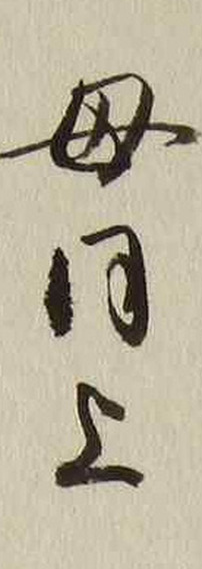母同上
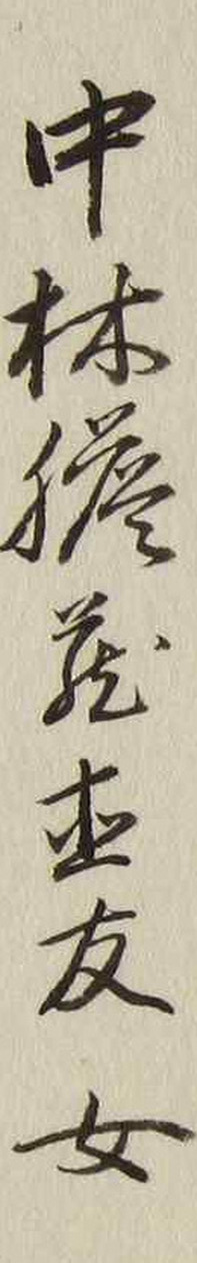中林膳蔵直友女

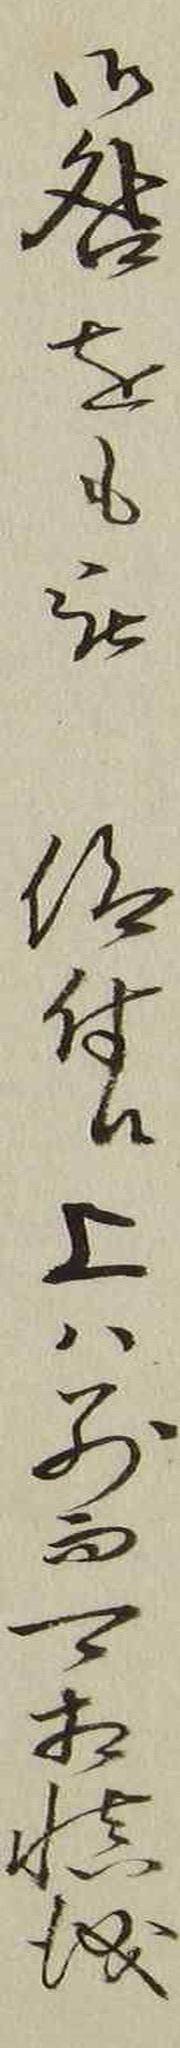御咎をも被仰付候上ハ別而可相慎儀
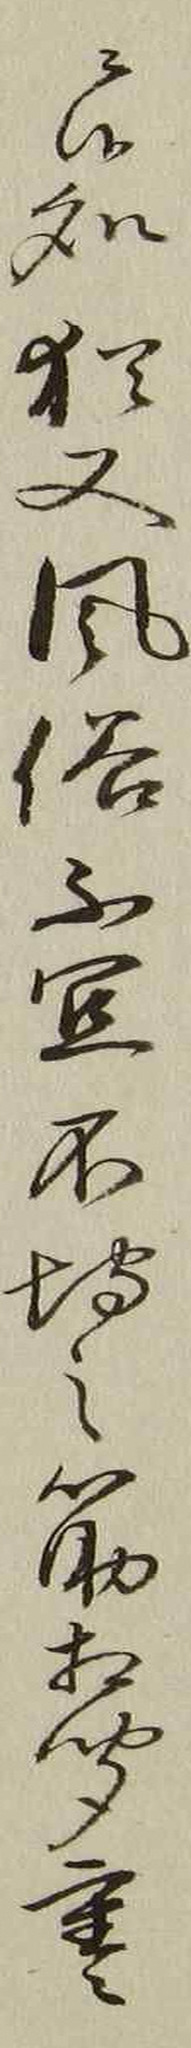ニ候処猶又風俗ふ宜不埒之筋相聞重々
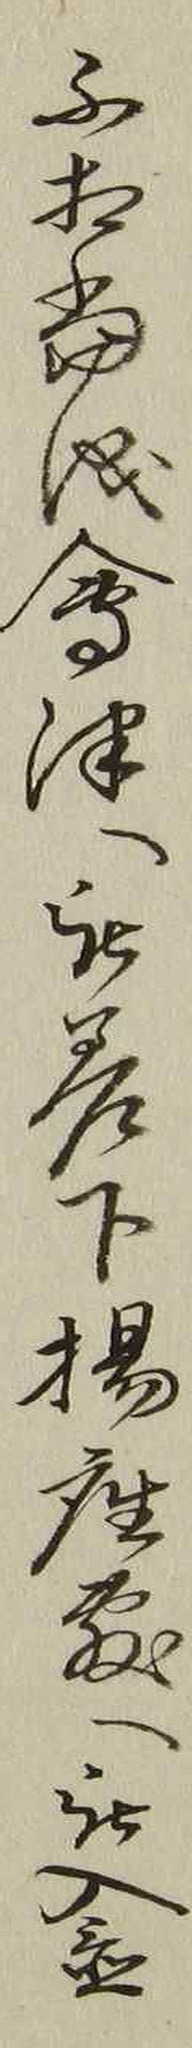ふ相当儀会津へ被差下揚座敷へ被入置
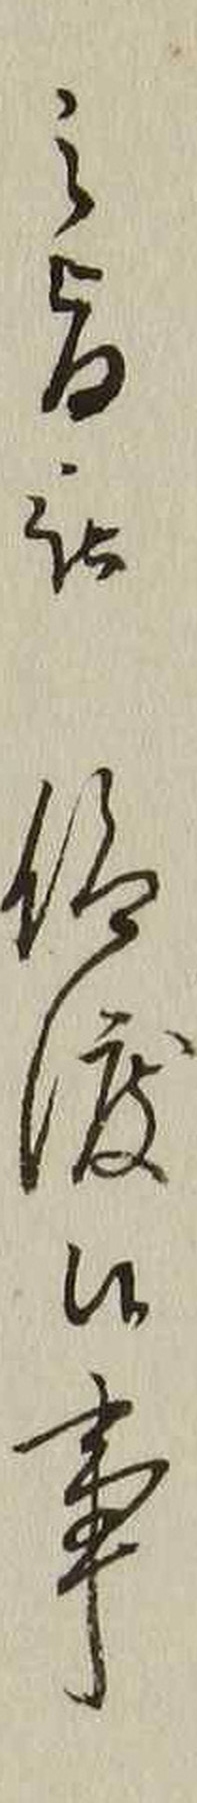之旨被仰渡候事
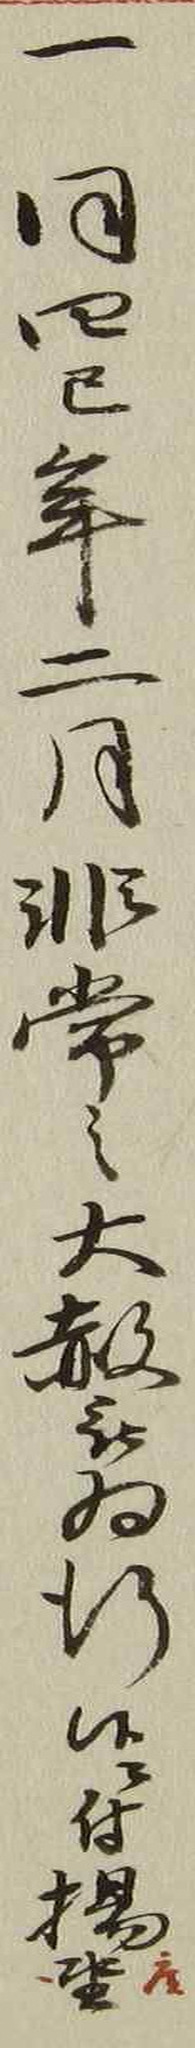一同四巳年二月非常之大赦被ゐ行候ニ付揚坐
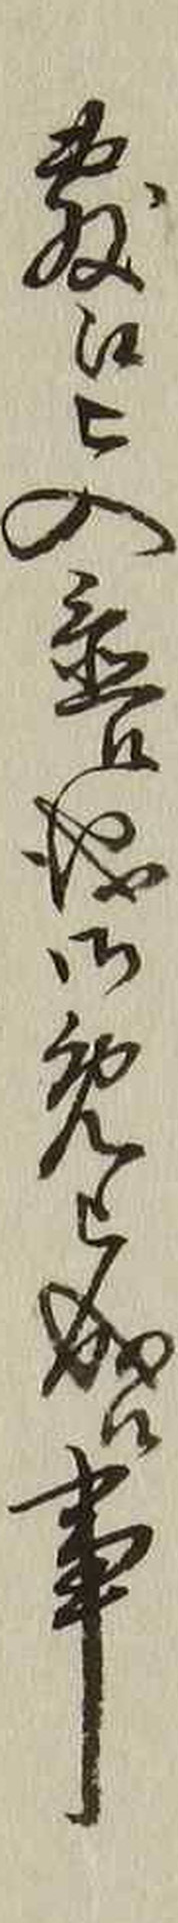敷江被入置候義御免被成候事
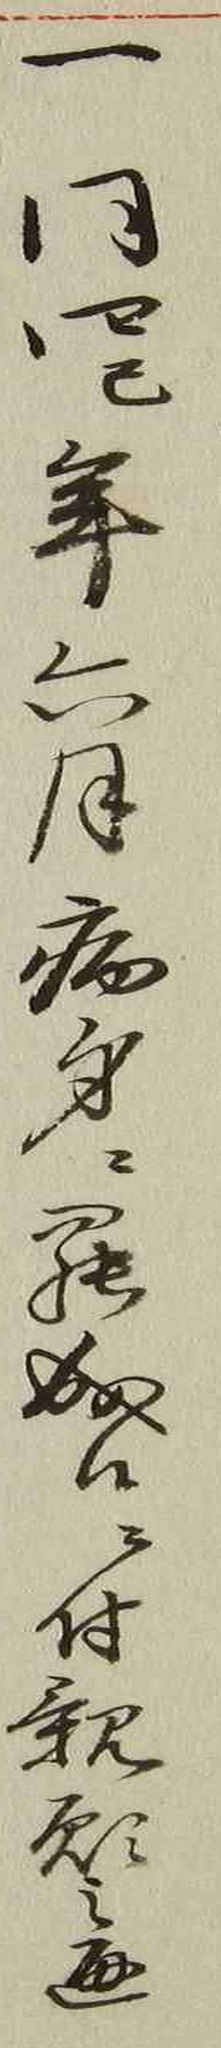一同四巳年六月病身ニ罷成候ニ付親願之通
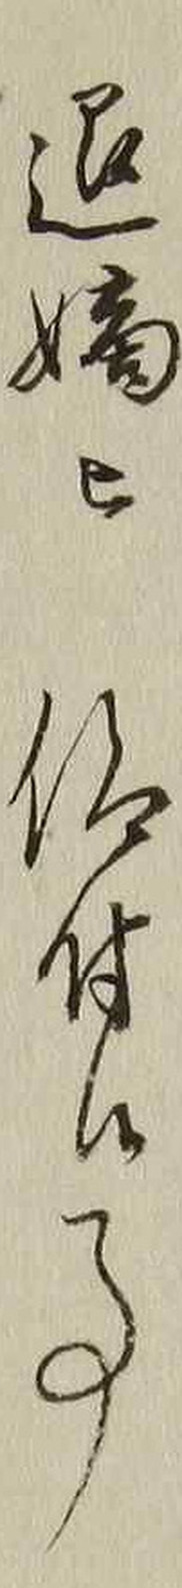退嫡被仰付候事
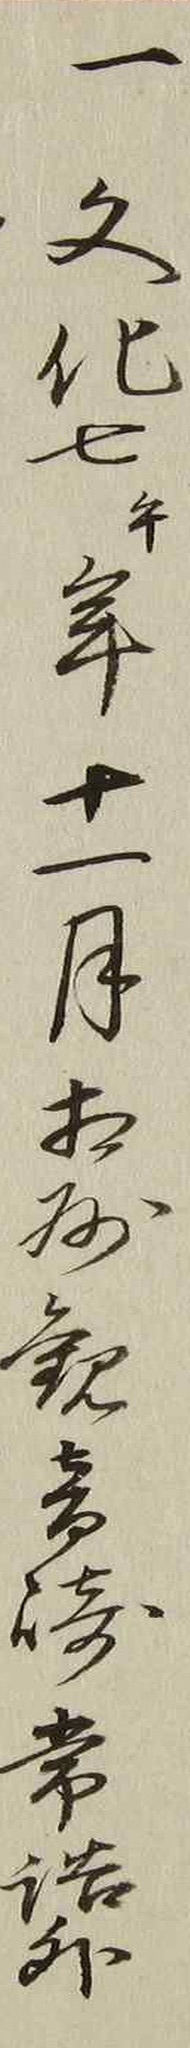一文化七午年十一月相州観音崎常詰外
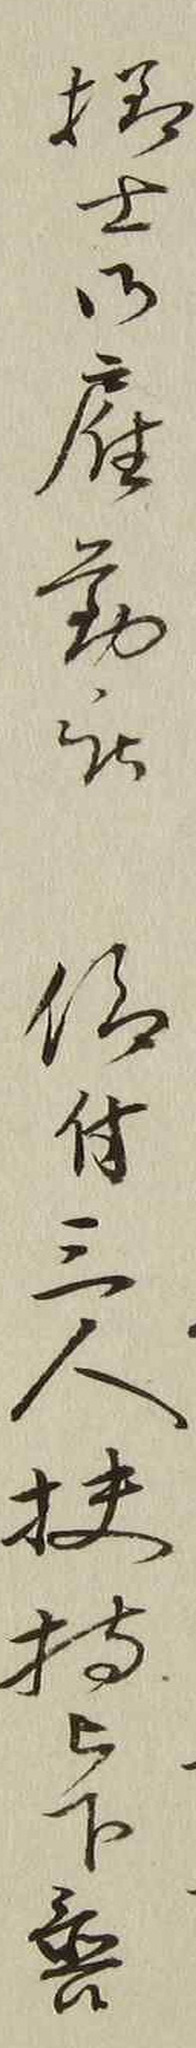様士御雇勤被仰付三人扶持被下置候
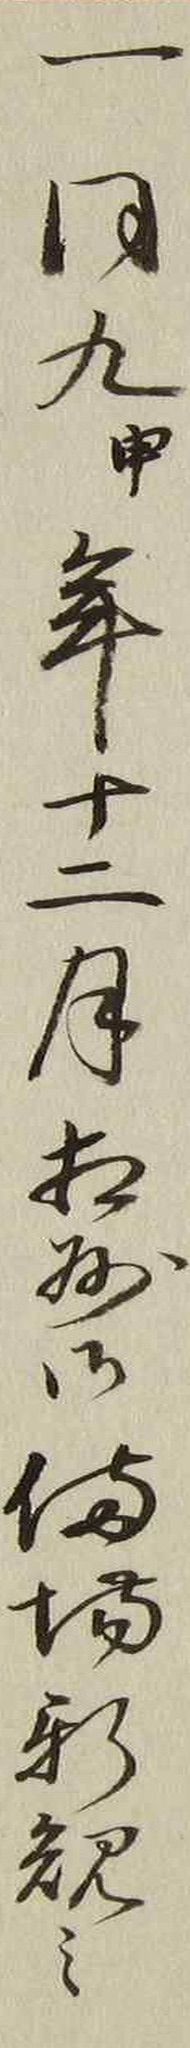一同九申年十二月相州御備場新規之
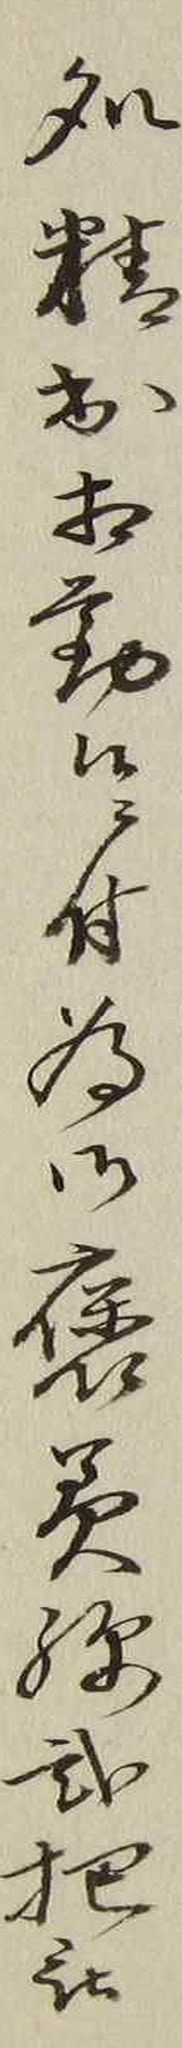処精出相勤候ニ付為御褒美綿弐把被
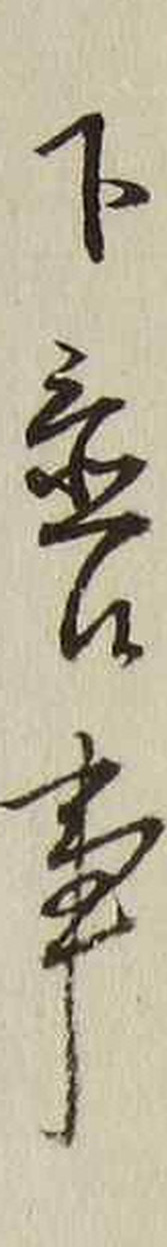下置候事
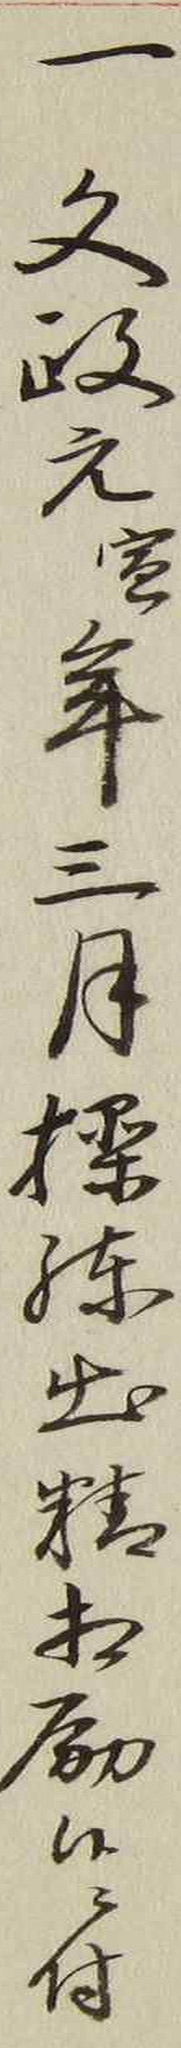一文政元寅年三月操練出精相励候ニ付
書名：諸士系譜　巻之114　か之部22
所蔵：会津若松市立会津図書館
